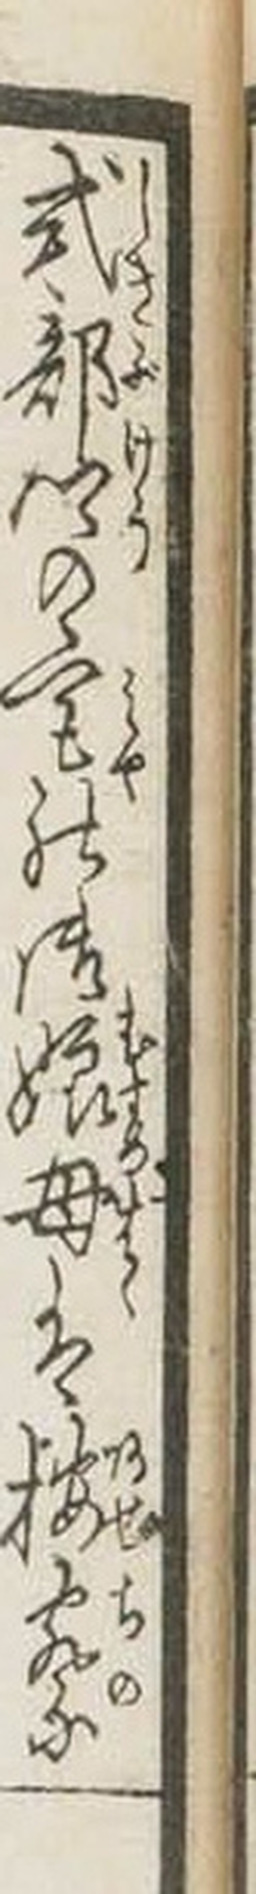式部卿の宮の御娘母は按察
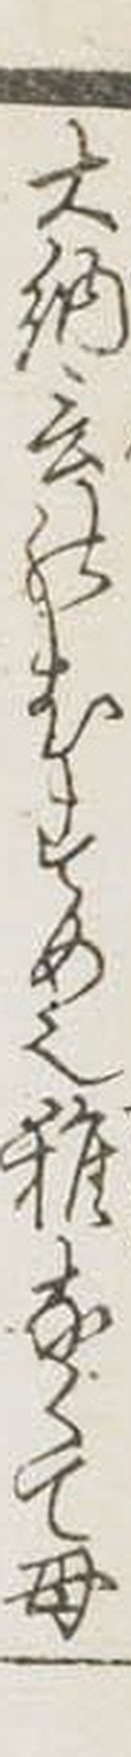大納言のむすめ也稚なくて母
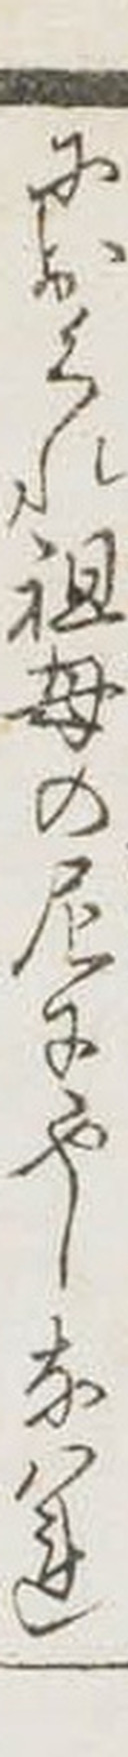におくれ祖母の尼にやしなはれ
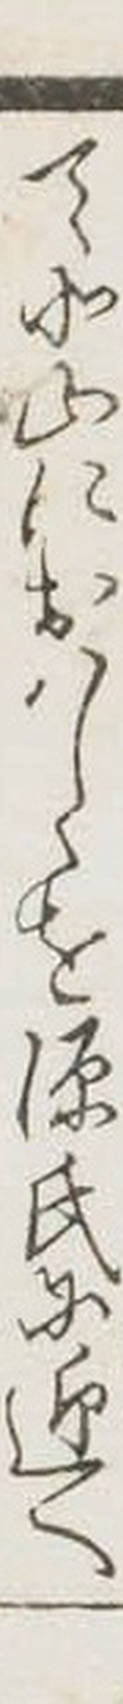て北山におはしゝを源氏に迎へ
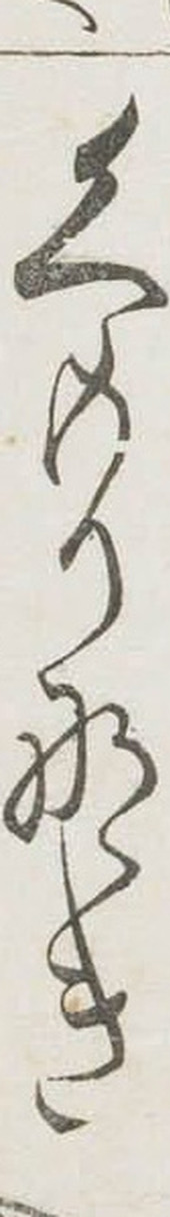くもりなき
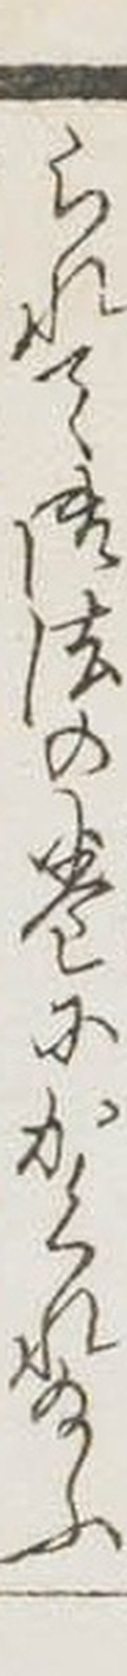られて御法の巻にかくれ給ふ
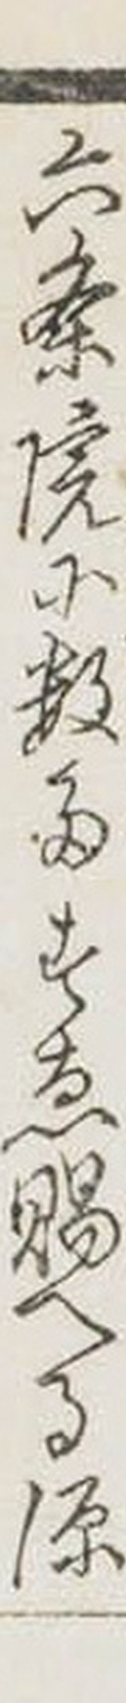六条院に数多すゑ賜へる源
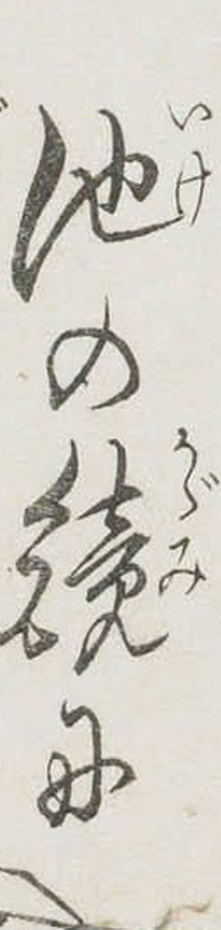池の鏡に
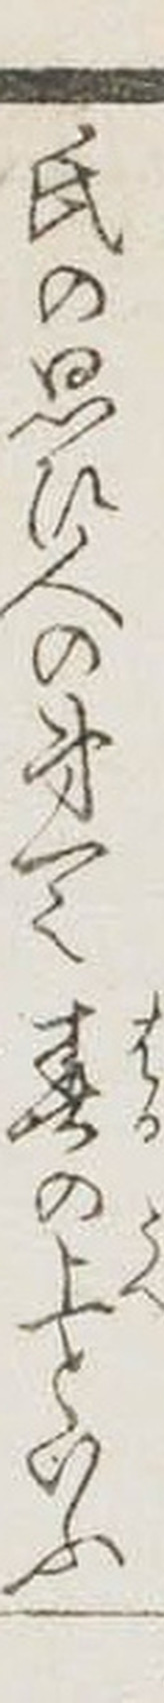氏の思ひ人の第一也春の上といふ
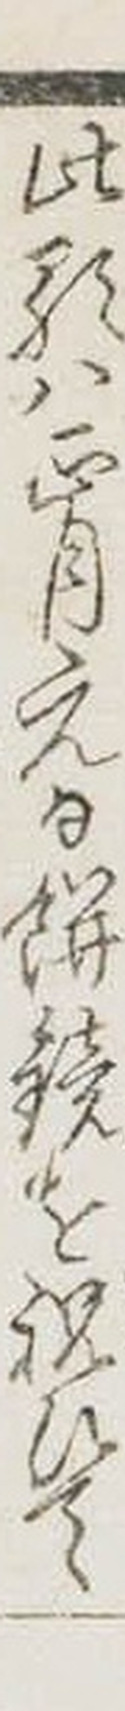此歌は正月元日餅鏡を祝ひて
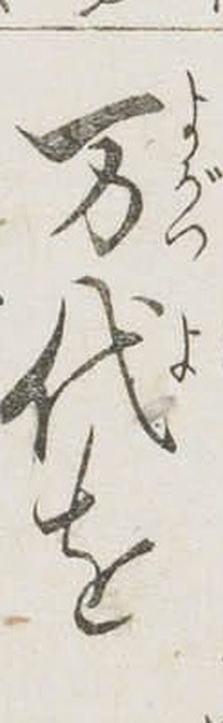万代を
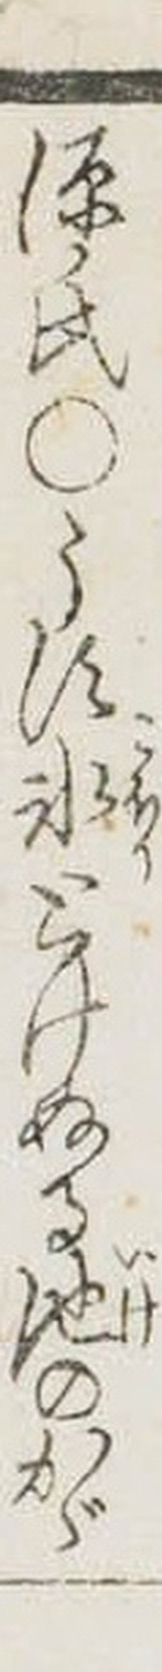源氏○うす氷とけぬる池のかゞ
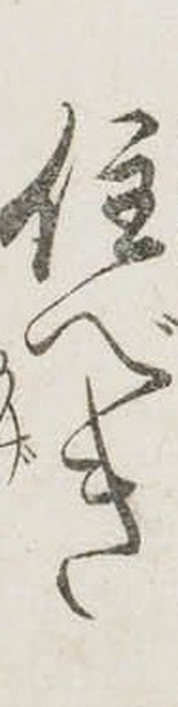住べき
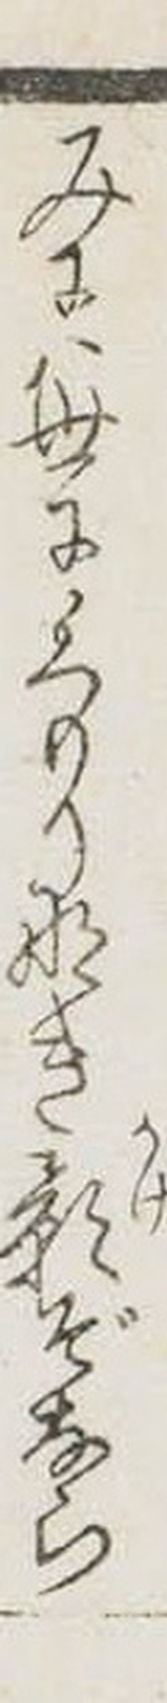みには世にみのりなき影ぞなら
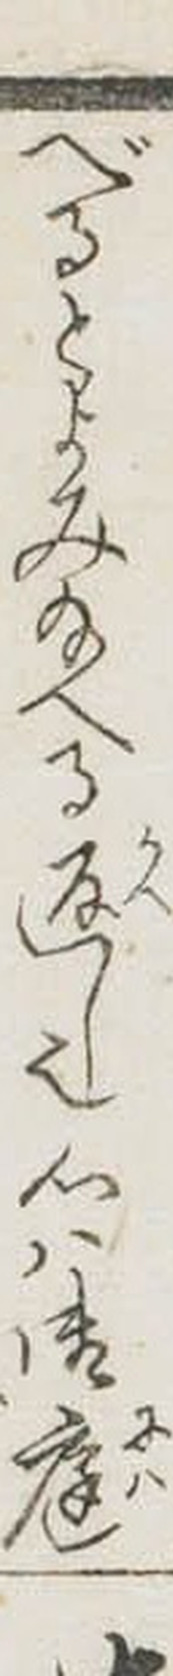べるとよみ給へる返し也心は御庭
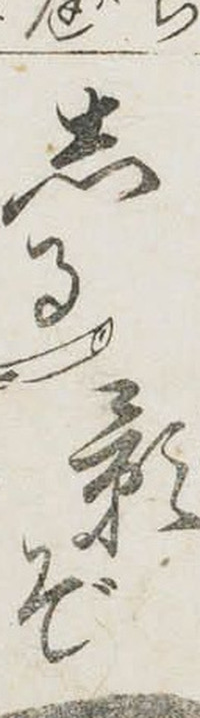しるぞ
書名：源氏百人一首
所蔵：東京学芸大学教育コンテンツアーカイブ
